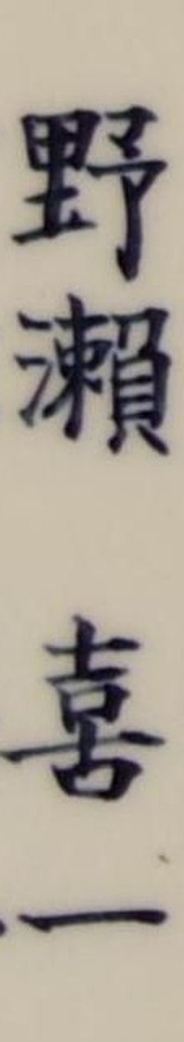野瀬喜一
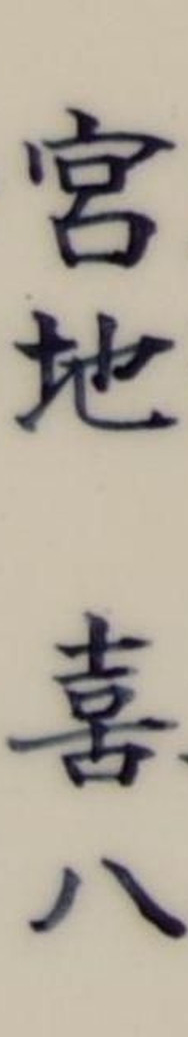宮地喜八
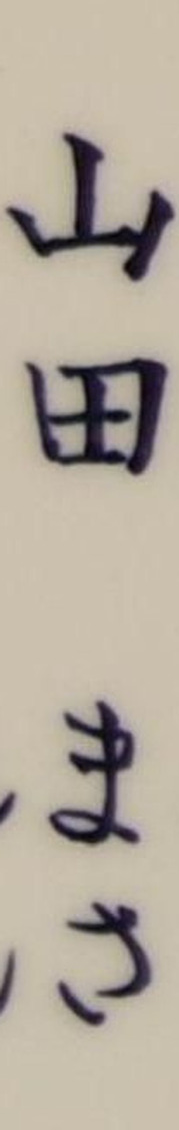山田まさ
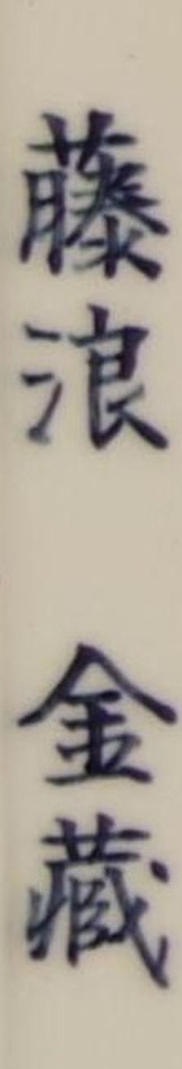藤浪金蔵

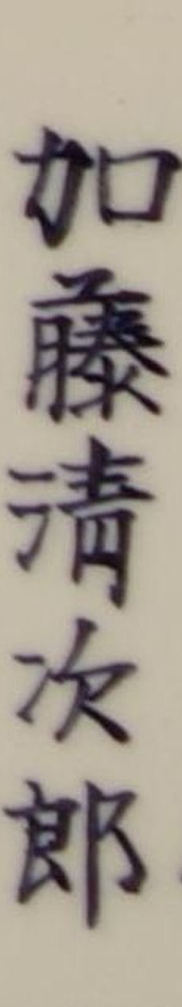加藤清次郎
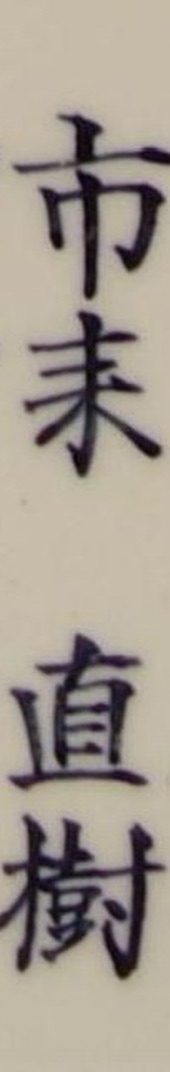市来直樹
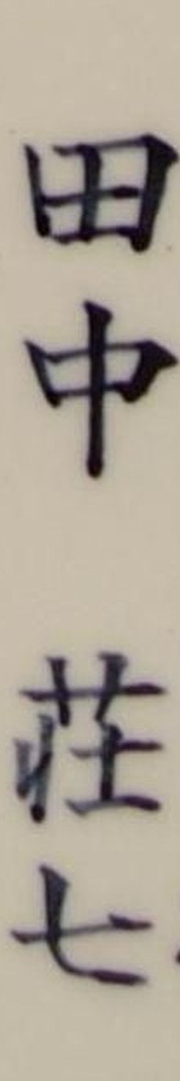田中荘七
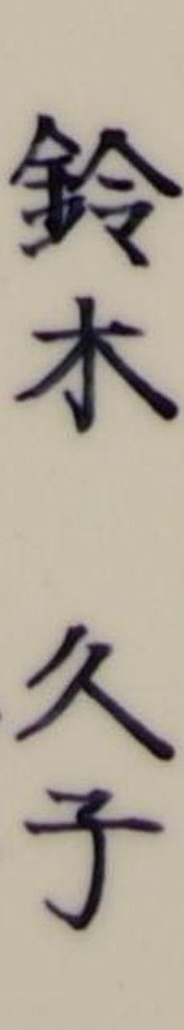鈴木久子
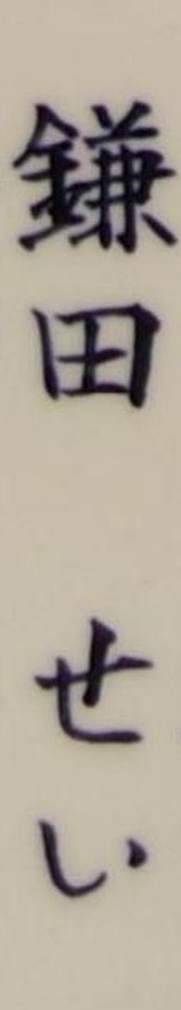鎌田せい
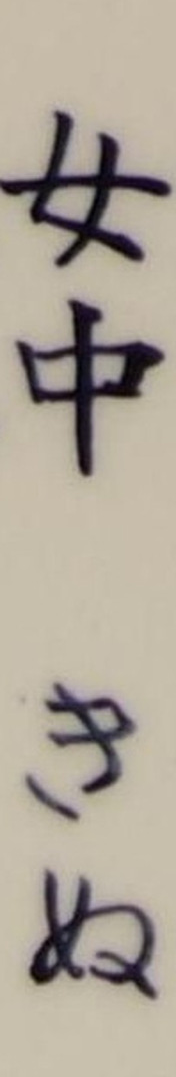女中きぬ
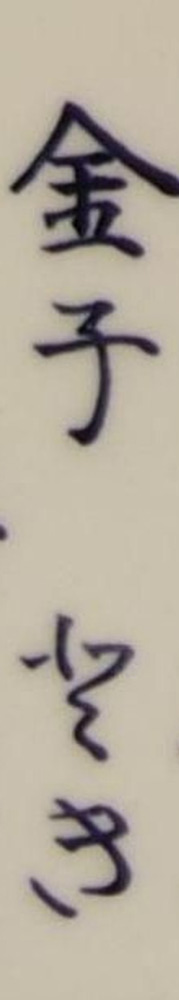金子とき
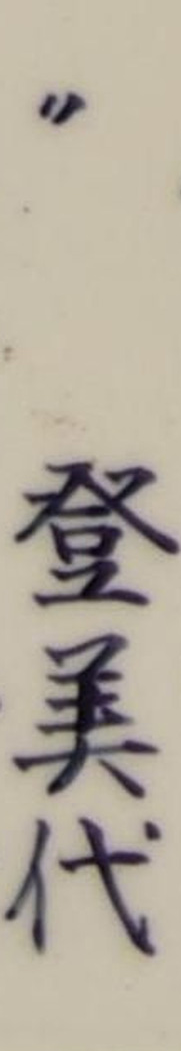登美代
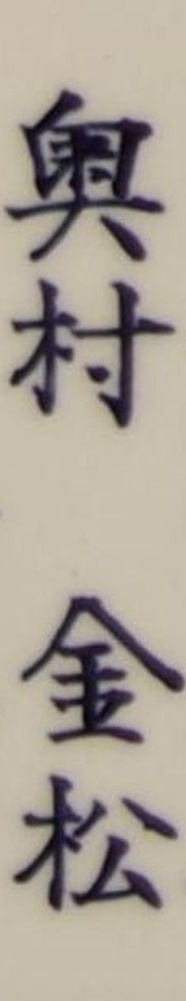奥村金松
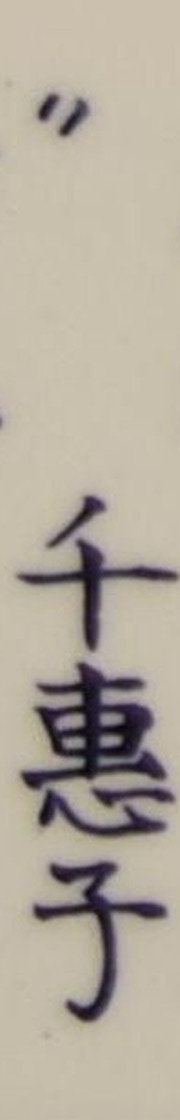千恵子
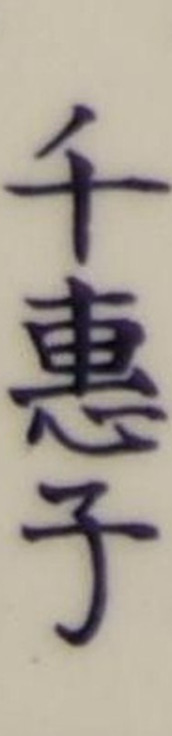千恵子
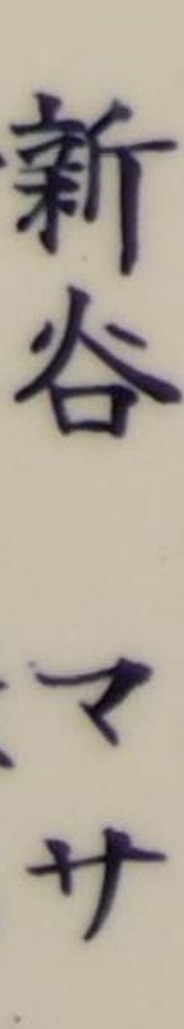新谷マサ
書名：E~L
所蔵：高野山金剛峯寺
